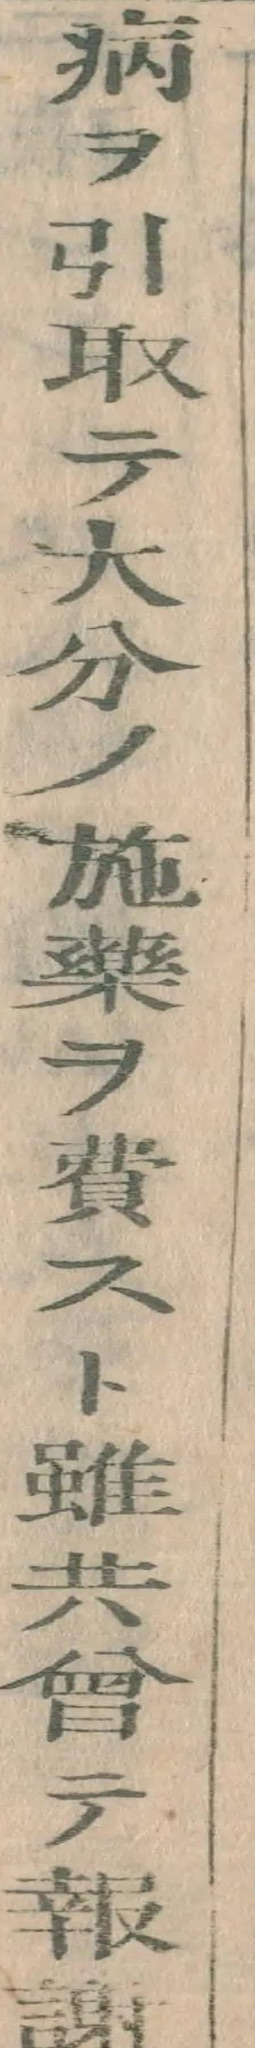病ヲ引取テ大分ノ施薬ヲ費スト雖共曽テ報謝
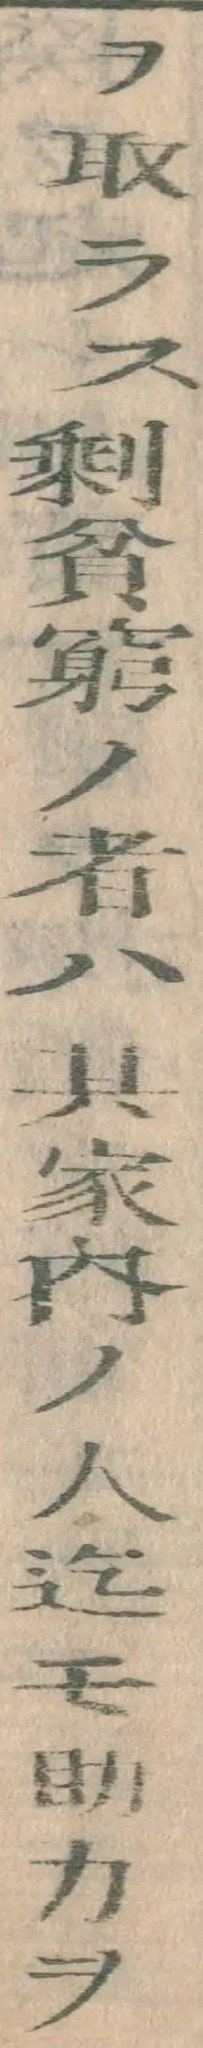ヲ取ラス剰貧窮ノ者ハ其家内ノ人迄モ助力ヲ
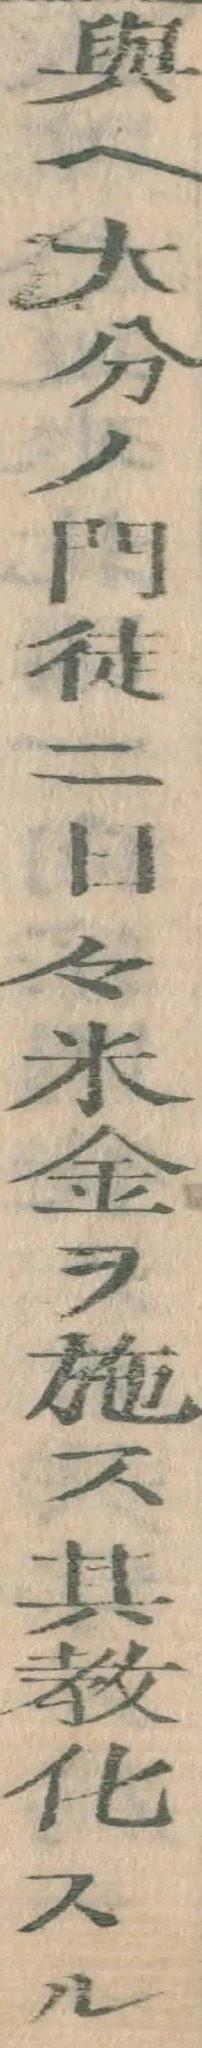与ヘ大分ノ門徒ニ日々米金ヲ施ス其教化スル
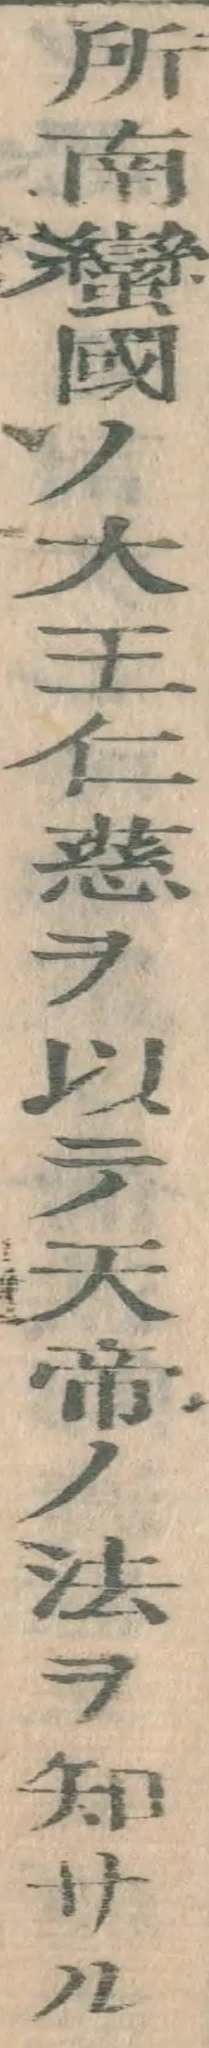所南蛮国ノ大王仁慈ヲ以テ天帝ノ法ヲ知サル
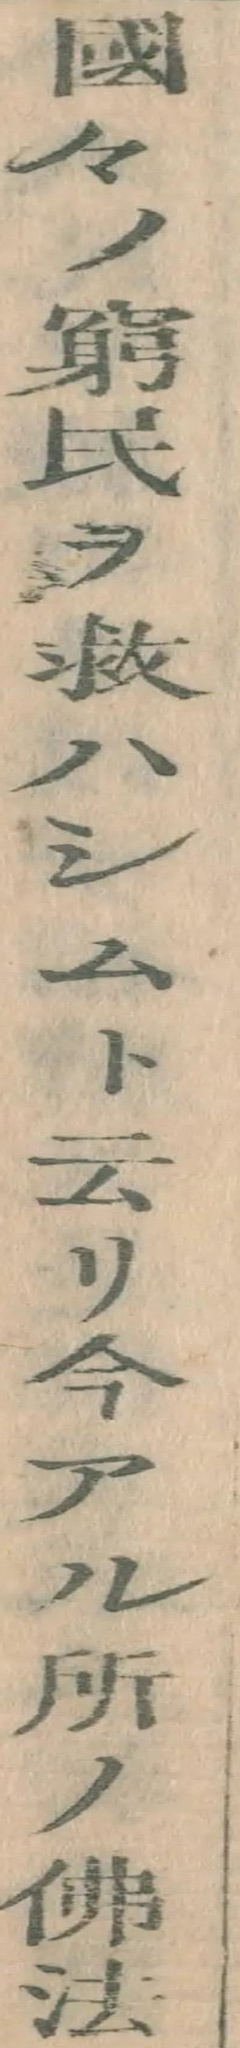国々ノ窮民ヲ救ハシムト云リ今アル所ノ仏法

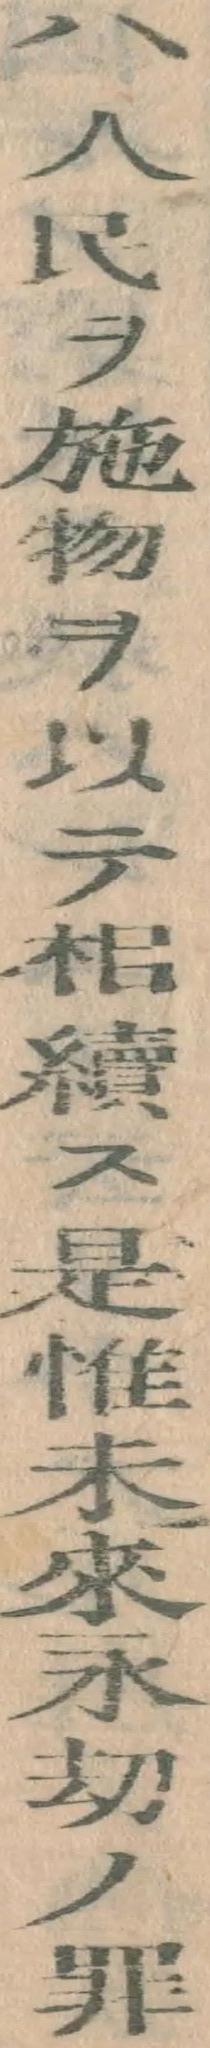ハ人民ヲ施物ヲ以テ㭒続ス是惟未来永劫ノ罪
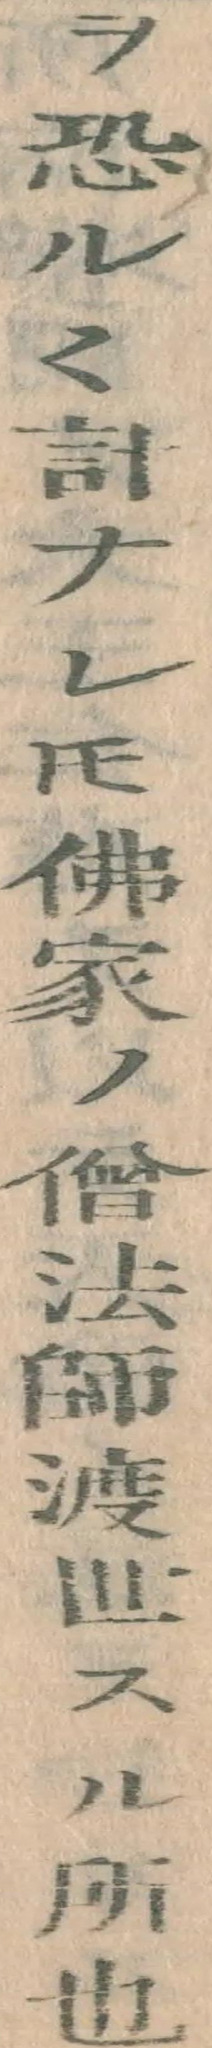ヲ恐ル〱計ナレトモ仏家ノ僧法師渡世スル所也
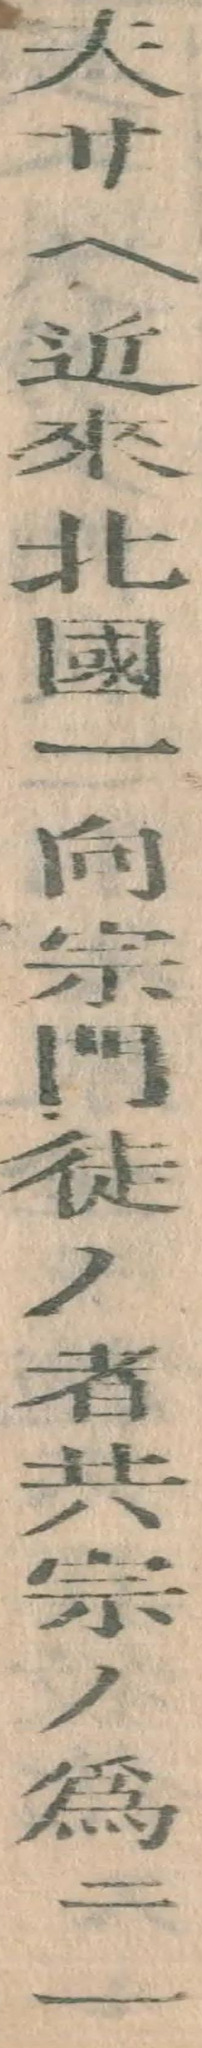夫サヘ近来北国一向宗門徒ノ者共宗ノ為ニ一
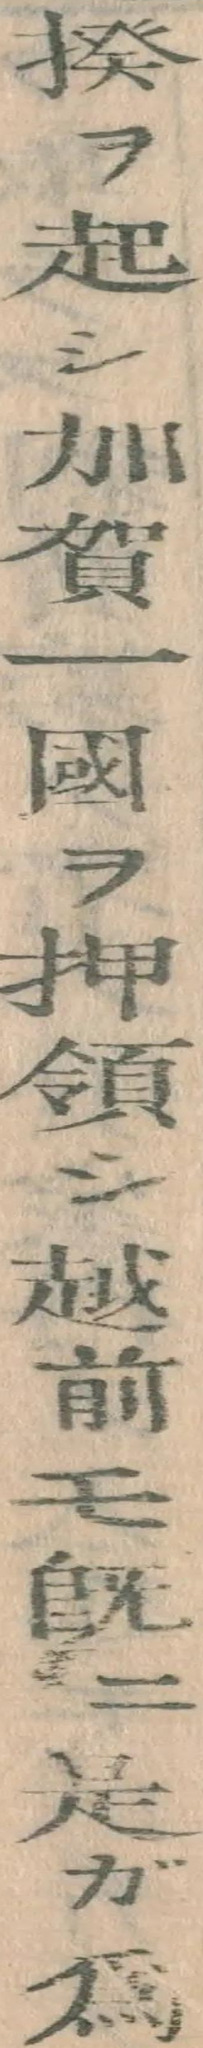揆ヲ起シ加賀一国ヲ押領シ越前モ既ニ是ガ為
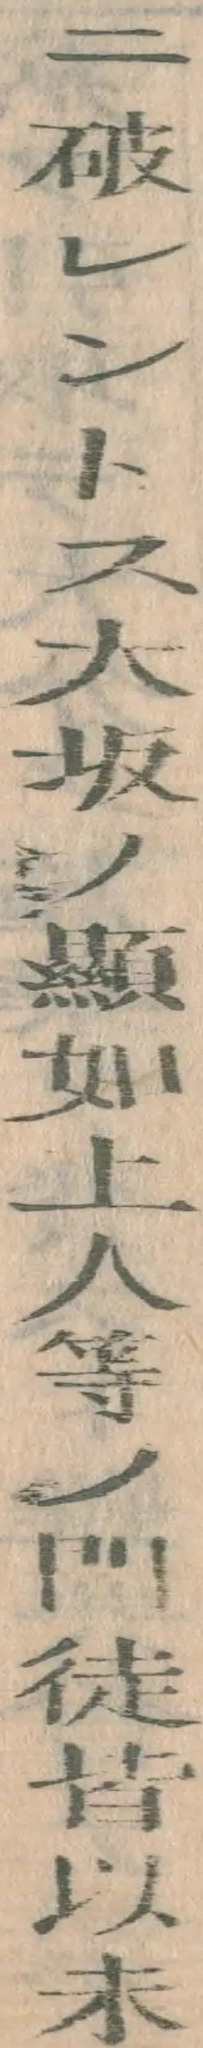ニ破レントス大坂ノ顕如上人等ノ門徒皆以未
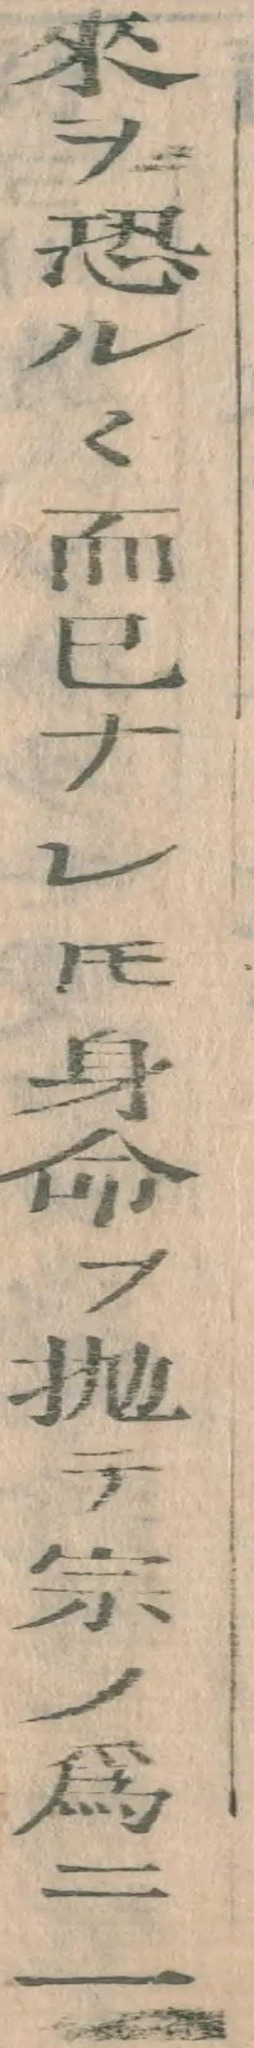来ヲ恐ル〱而已ナレトモ身命ヲ抛テ宗ノ為ニ一
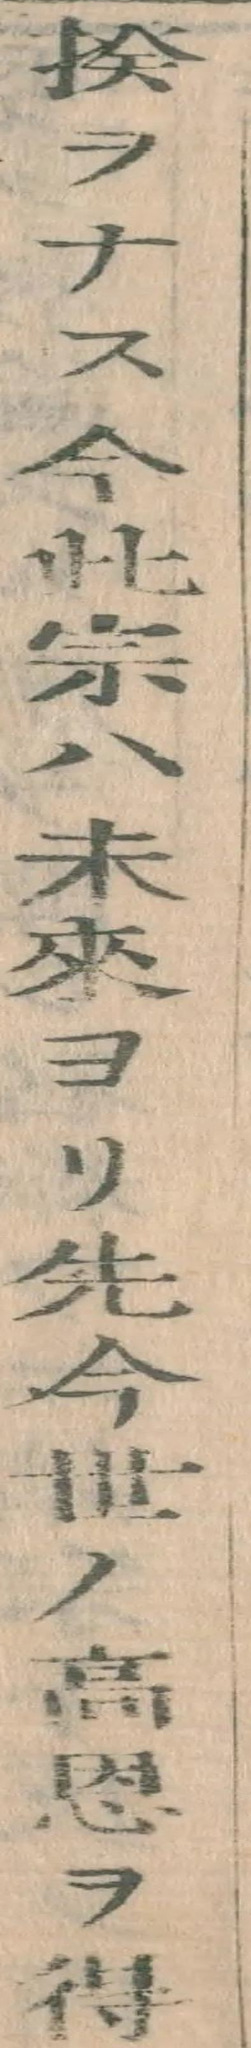揆ヲナス今此宗ハ未来ヨリ先今世ノ高恩ヲ得
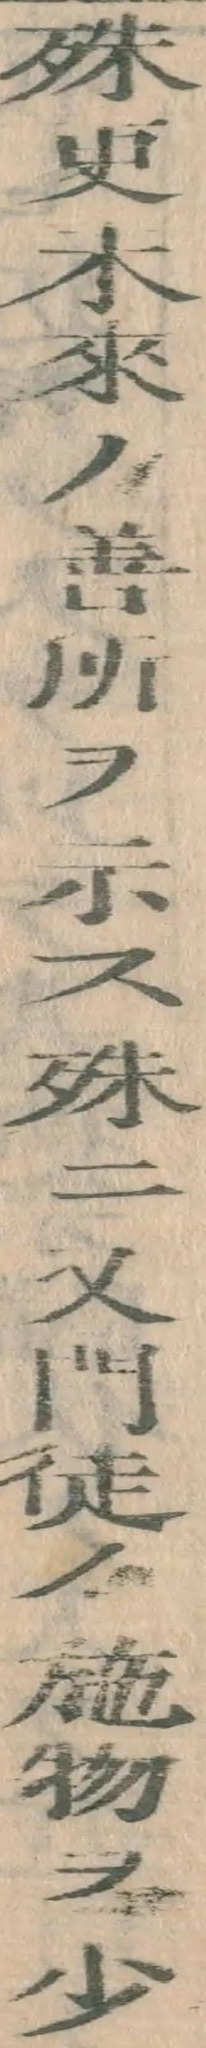殊更未来ノ善所ヲ示ス殊ニ又門徒ノ施物ヲ少
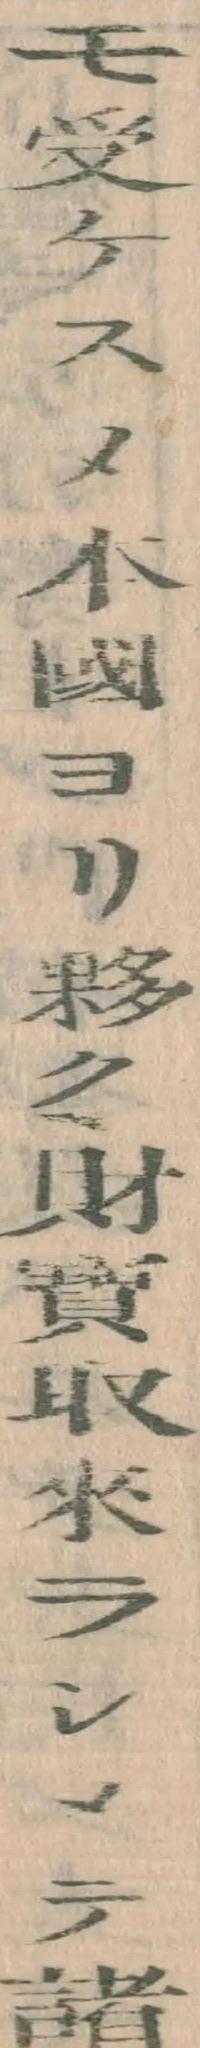モ受ケスシテ本国ヨリ夥ク財宝取来ラシメテ諸
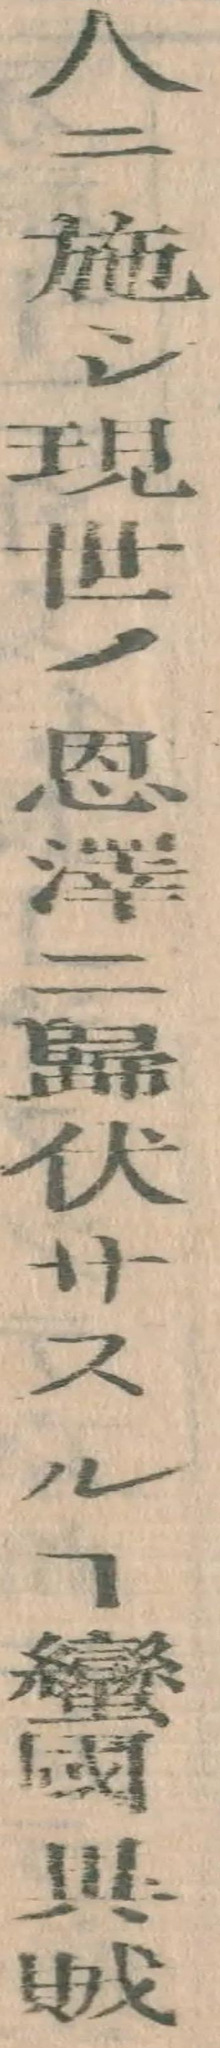人ニ施シ現世ノ恩沢ニ帰伏サスルヿ蛮国異賊
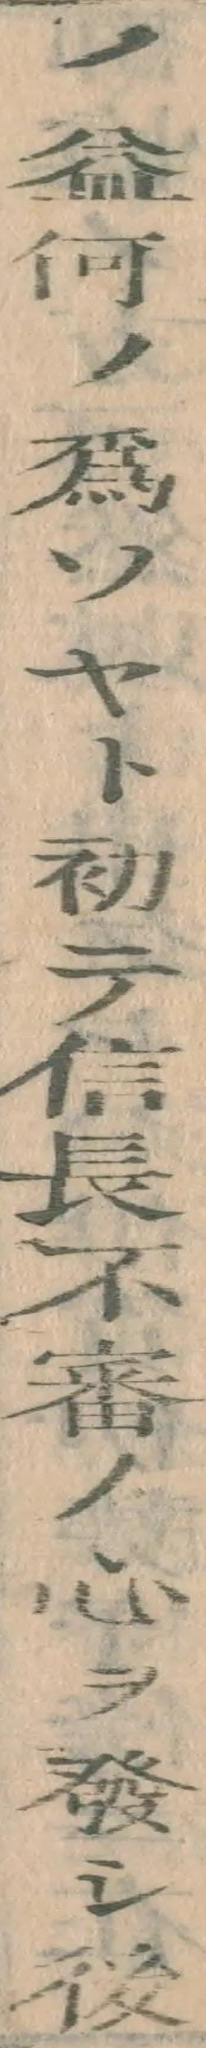ノ益何ノ為ソヤト初テ信長不審ノ心ヲ発シ後
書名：南蛮寺興廃記
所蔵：国立国会図書館 National Diet Library, JAPAN
